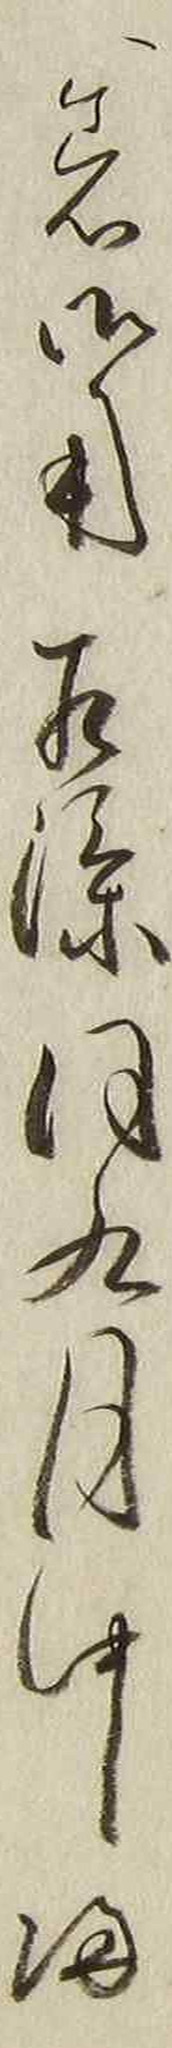へ着御用相済同九月中帰
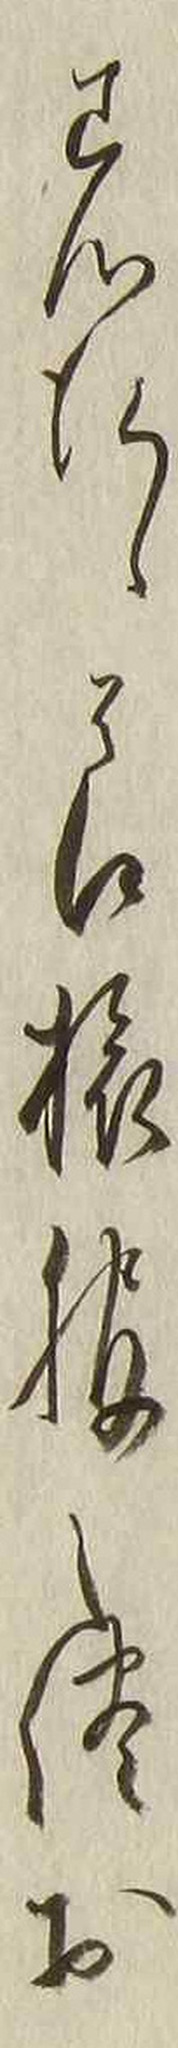着仕候節旅服之儘於

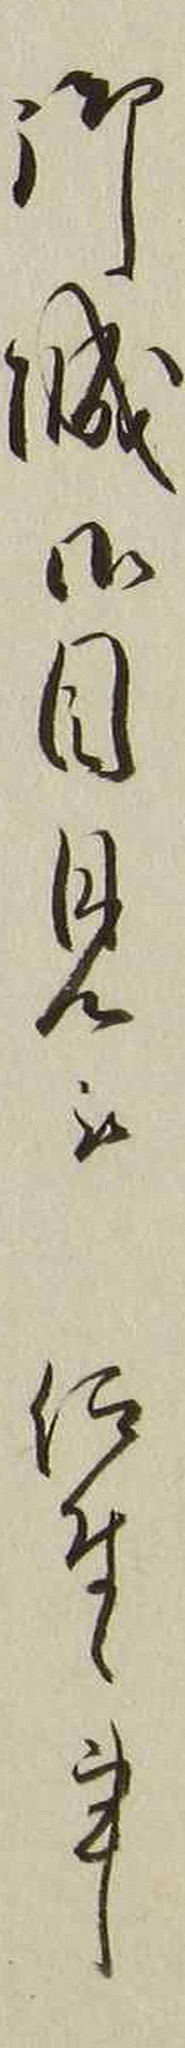御城御目見被仰付候事
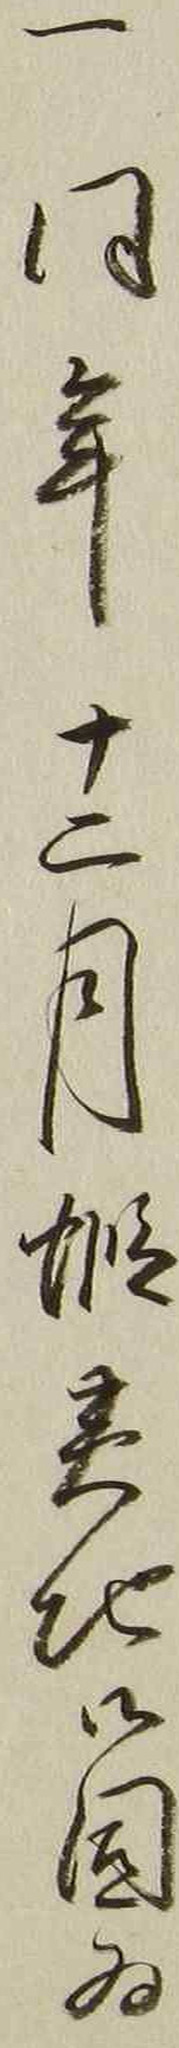一同年十二月蝦夷地御固為
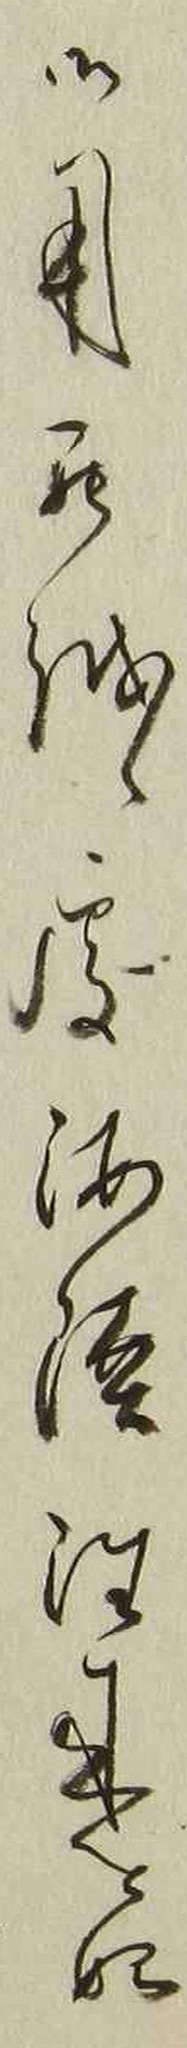御用罷越候処海陸往来を始
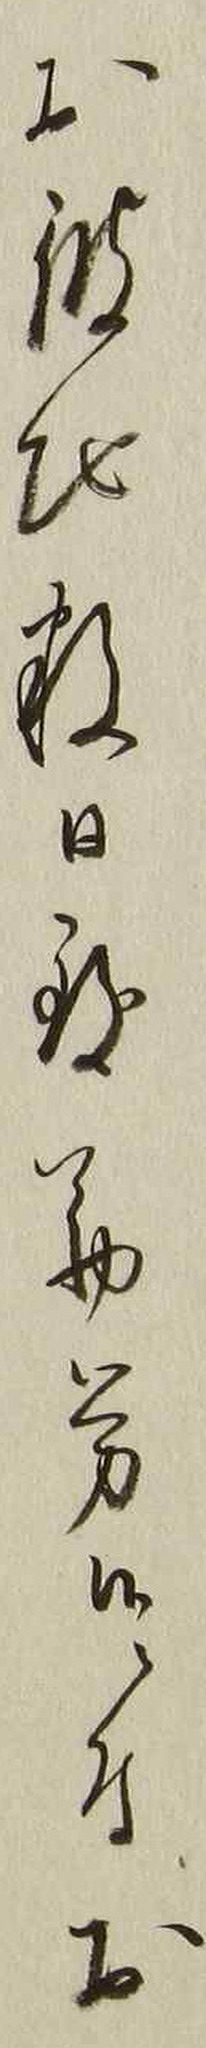於彼地数日致勤労候ニ付於
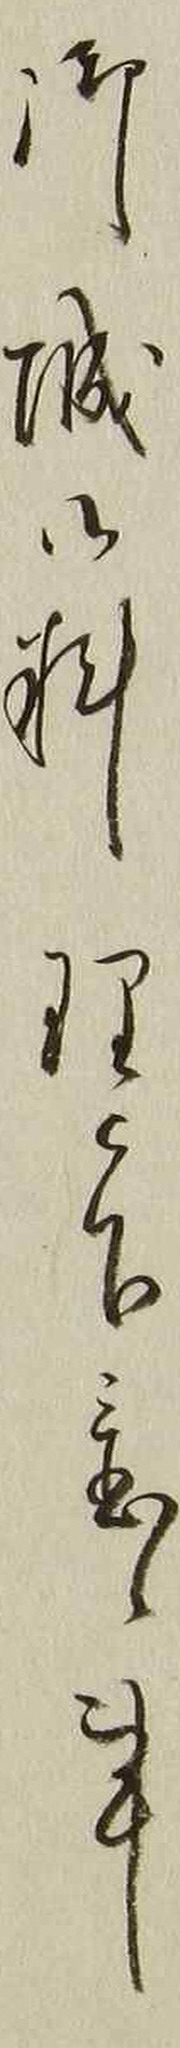御城御料理被下置候事
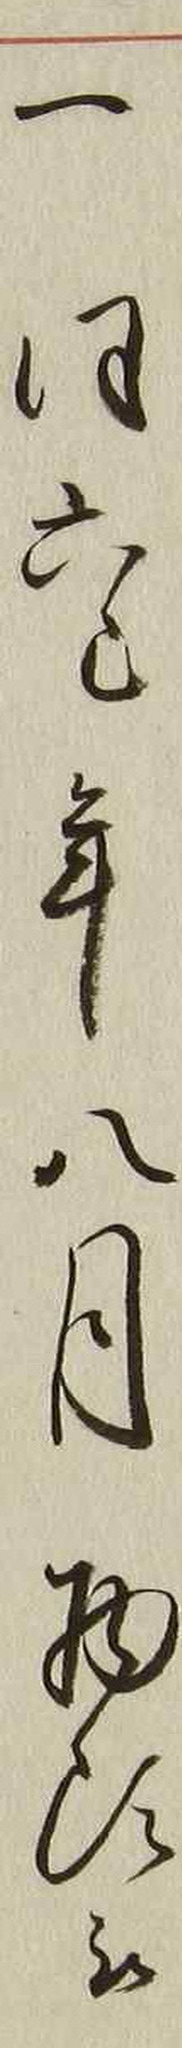一同六巳年八月物頭被
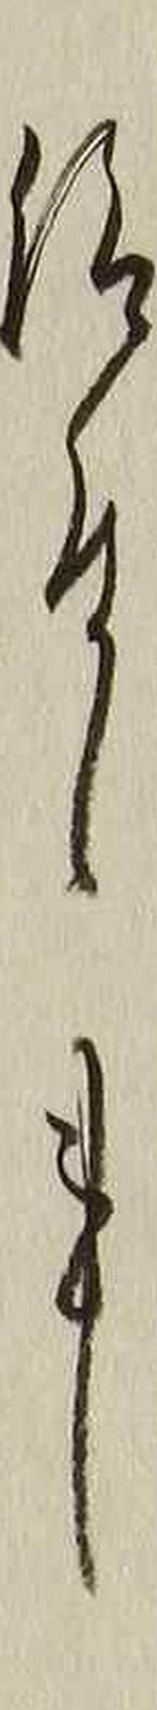仰付候事
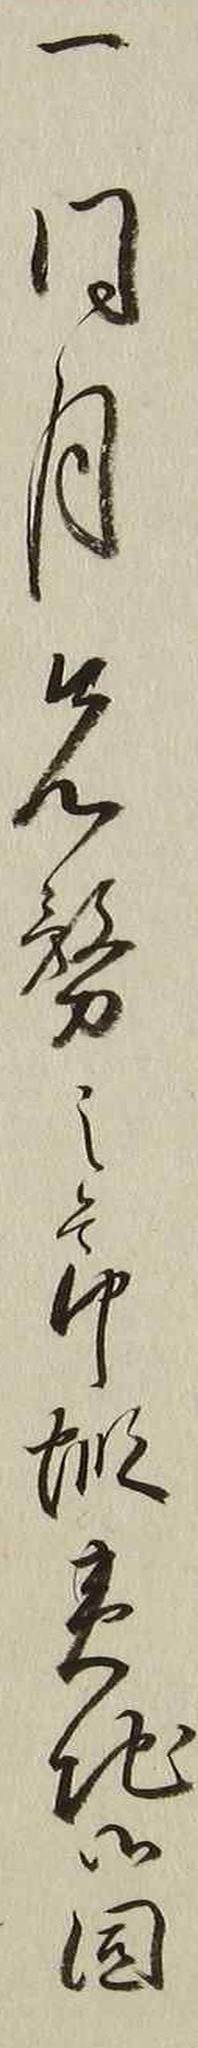一同月先務之節蝦夷地御固
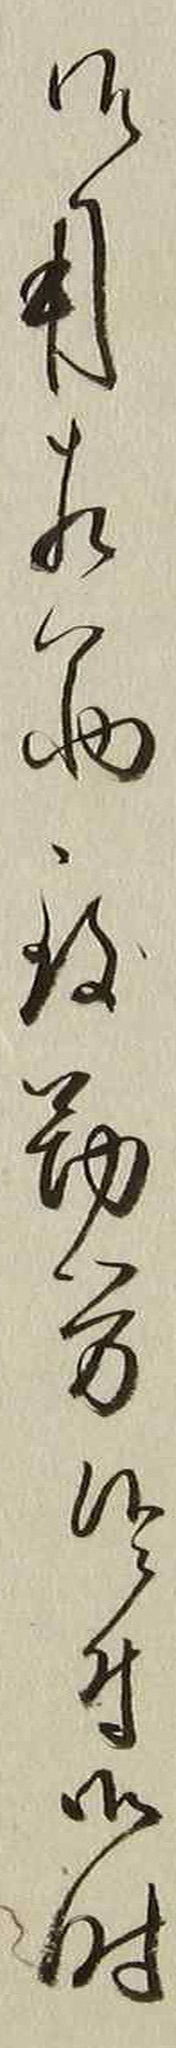御用相勤致勤労候ニ付御時
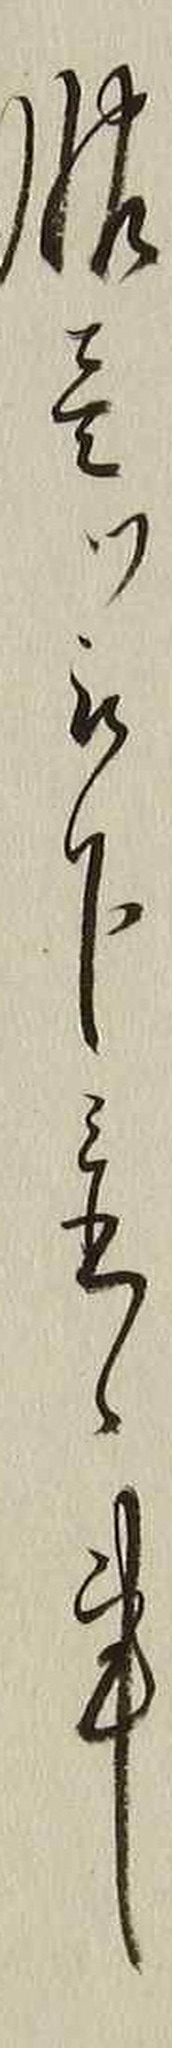服壱ツ被下置候事
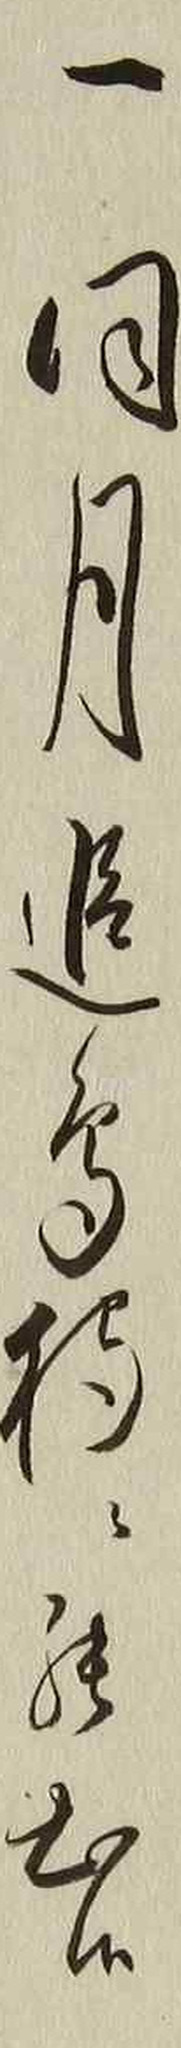一同月追鳥狩ニ罷出候
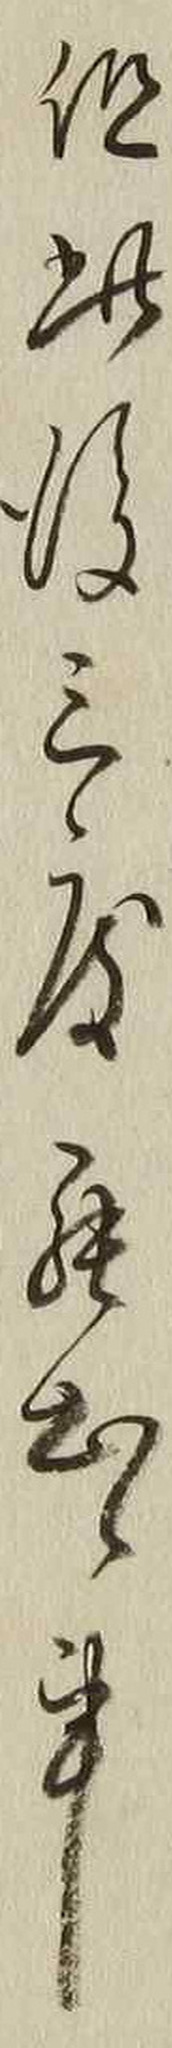但此後三度罷出候事
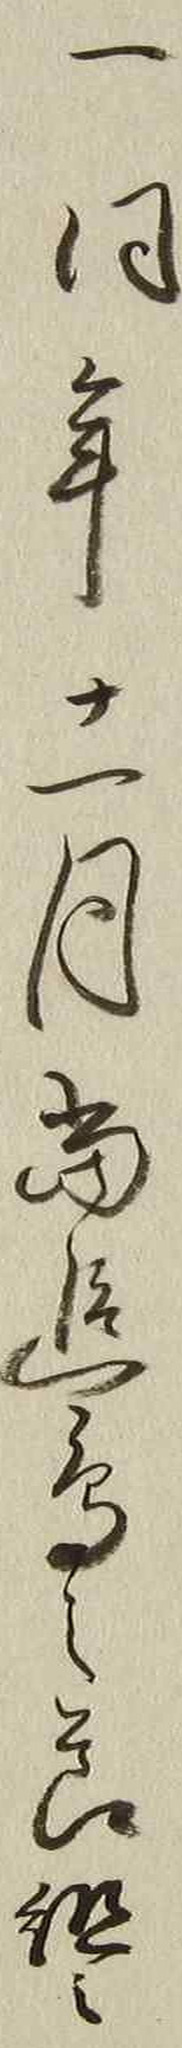一同年十一月当追鳥之節組之
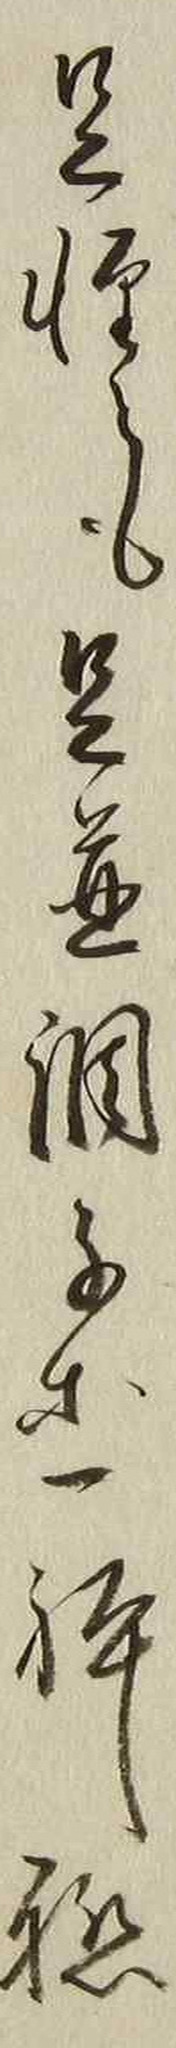足軽とも足並調子等一体聯
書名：諸士系譜　巻之18　い之部18
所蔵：会津若松市立会津図書館
